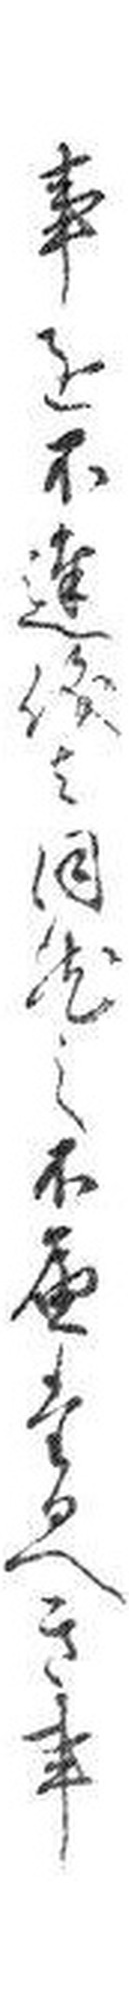事を不達儀者同然之不届たるへき事
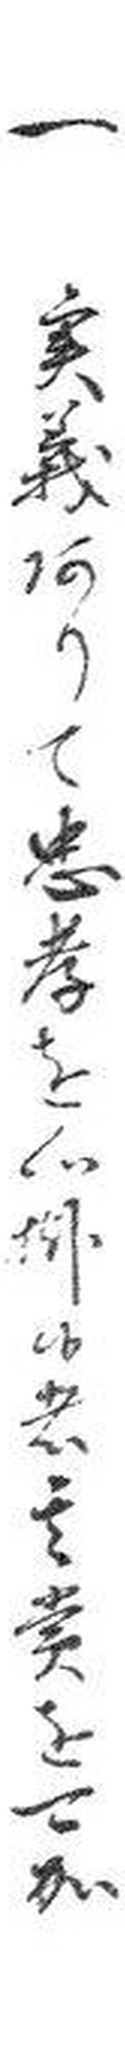一実義ありて忠孝を心掛候者其賞を可加
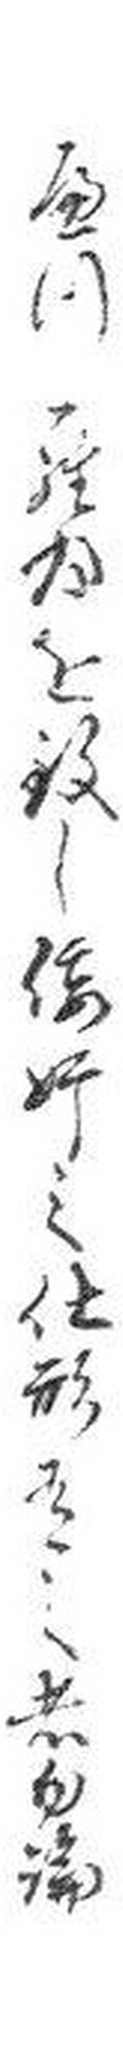へつらゐを致し佞奸之仕形有之者勿論
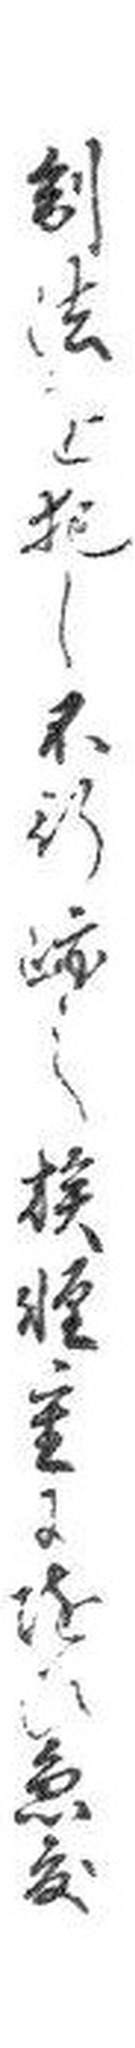制法を犯し不行跡之族軽重に随ひ急度
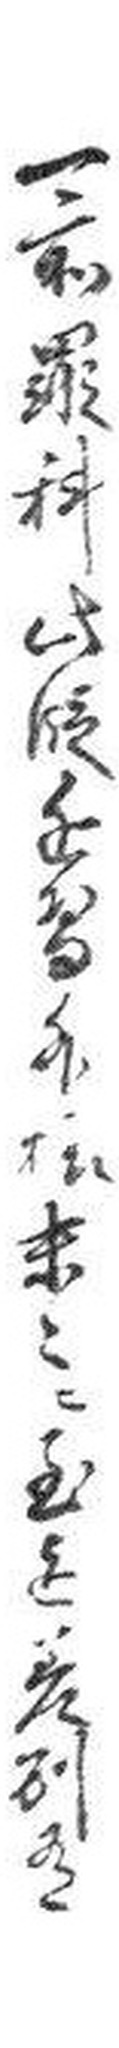可所罪科此段近習外様末々ニ至迄差別有
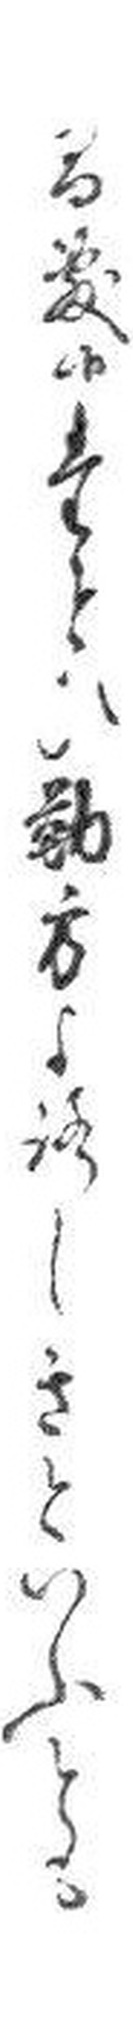間敷候たとひ勤方よろしきといふとも
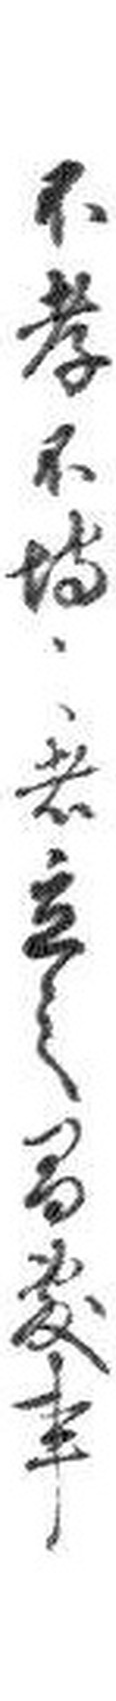不孝不埒之者立之間敷事
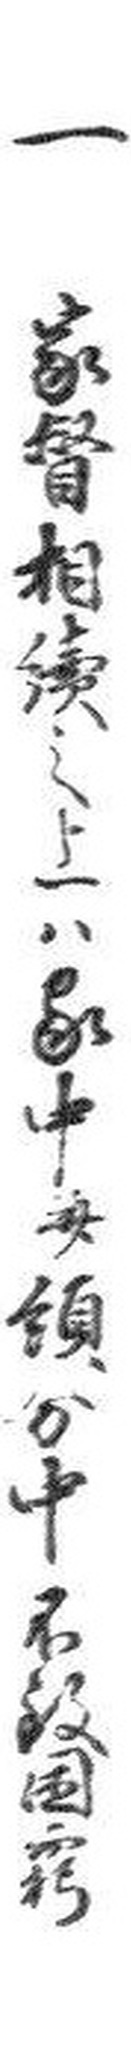一家督相続之上ハ家中并領分中不致困窮
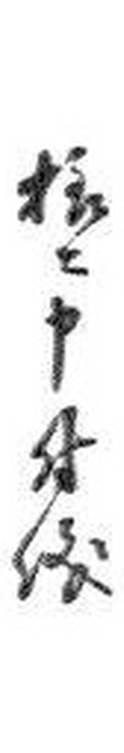様ニ申付儀
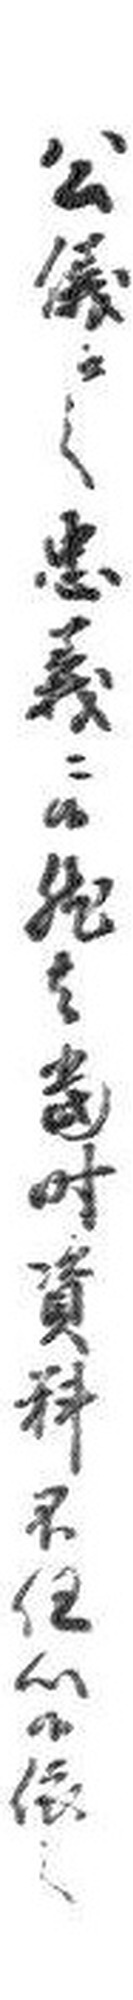公儀江之忠義ニ候然者当時資料不任心候依
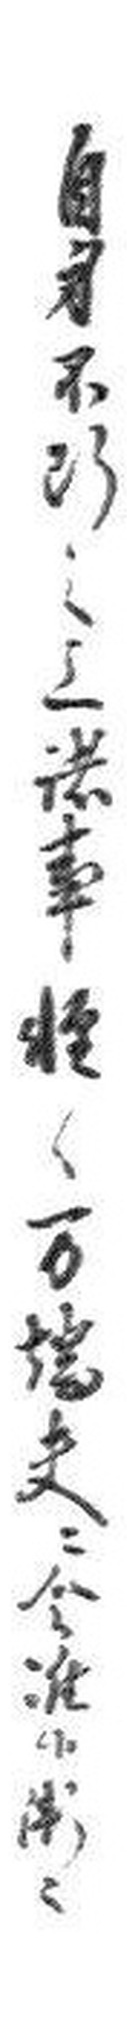自身不断之上諸亊軽く万端夫ニ令准候漸々
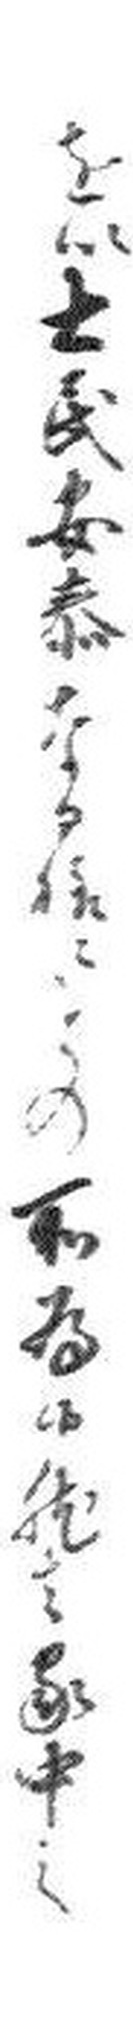を以士民安泰なる様ニとの所為候然者家中
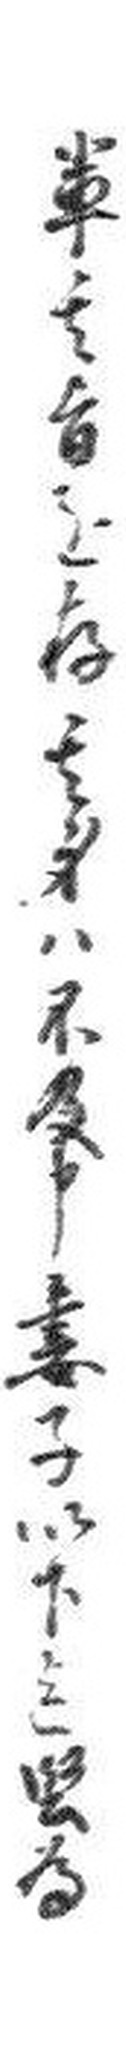輩其旨を存其身ハ不及申妻子以下迄堅為
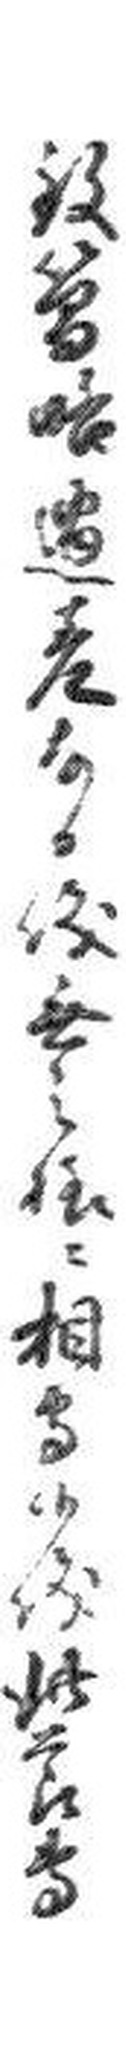致簡略過差なる儀無之様ニ相守候儀此節専
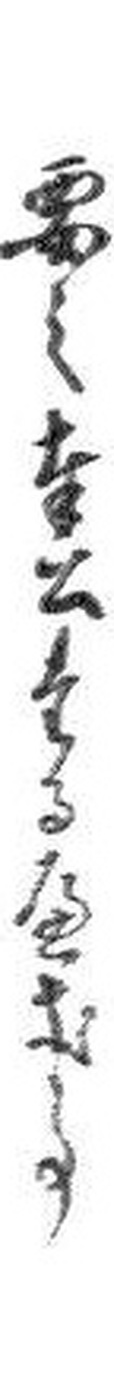要之奉公たるへき事
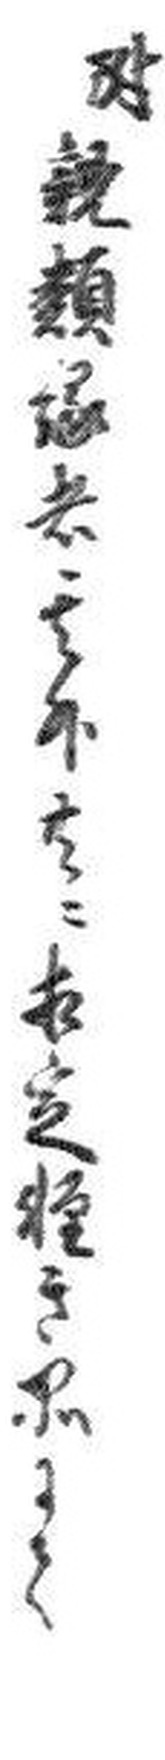親類縁者其外共ニ相定軽き品にて
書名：家譜 二十八 吉邦公 従宝永七年七月五日到正徳元年十二月
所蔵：福井県文書館 Fukui Prefectural Archives
